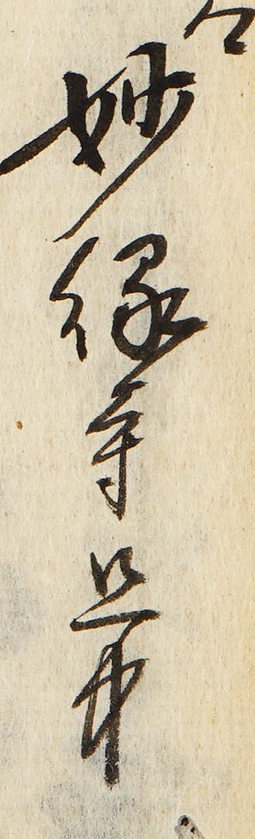妙縁寺旦中
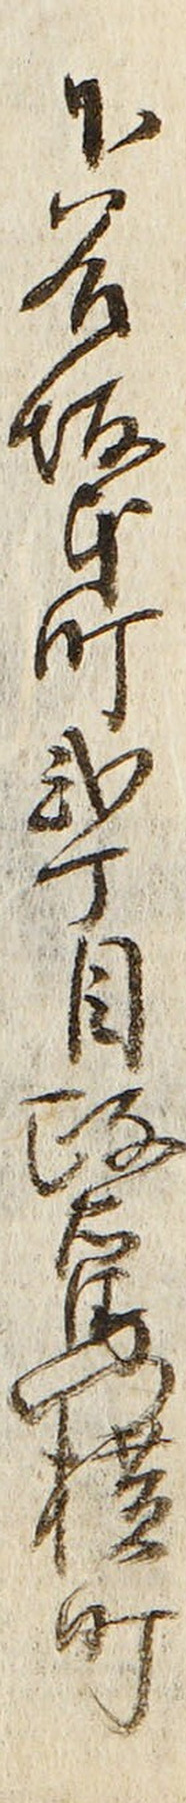下谷坂本町弐丁目政右衛門横町
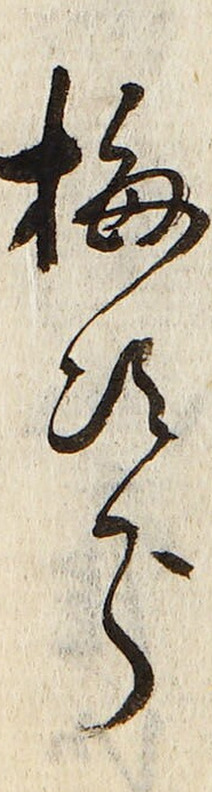梅次郎
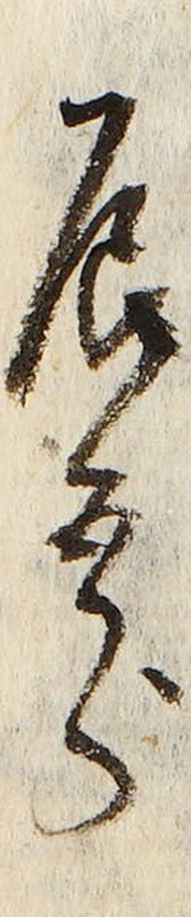辰五郎
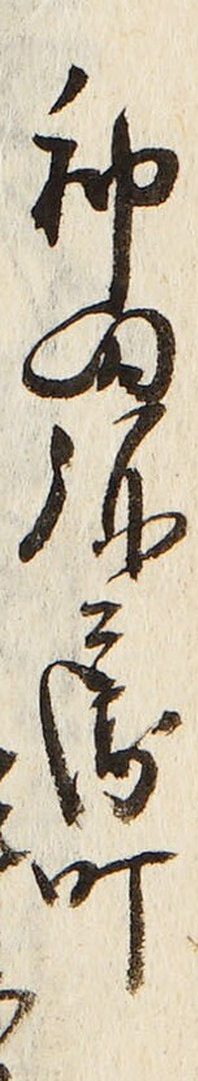神田弥兵衛町
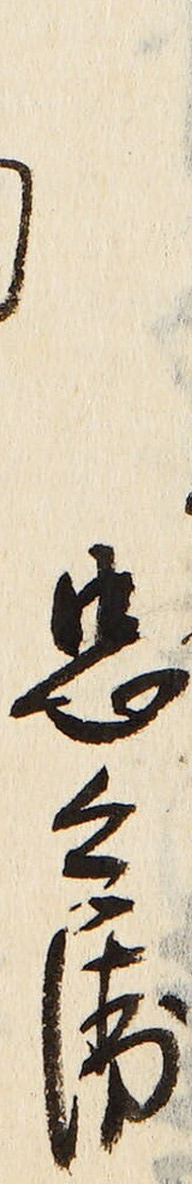忠兵衛
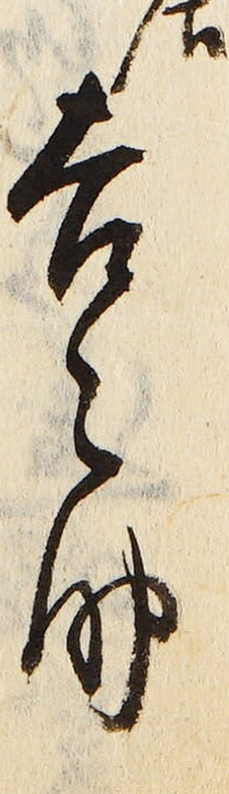吉之助
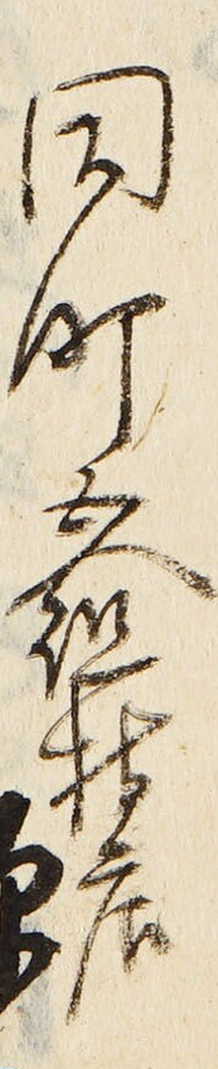同町五人組持店
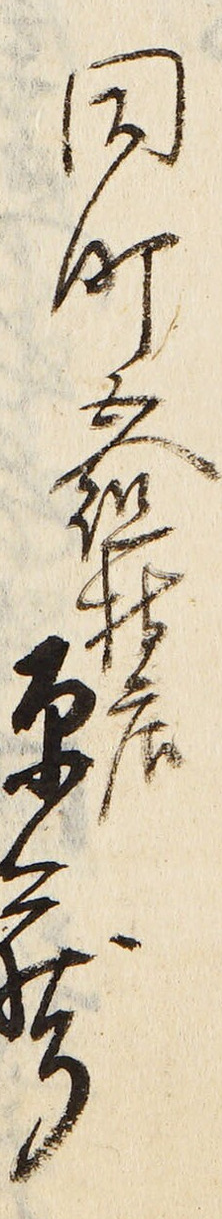同町五人組持店
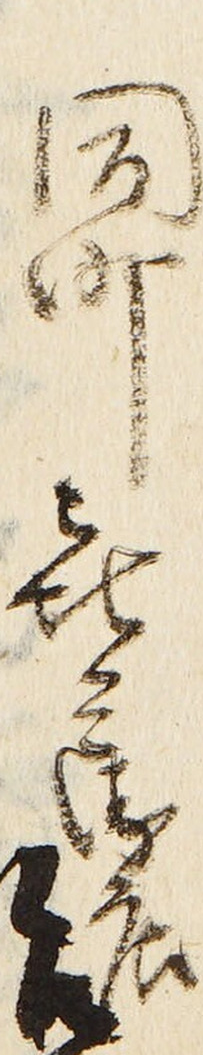同町喜兵衛店
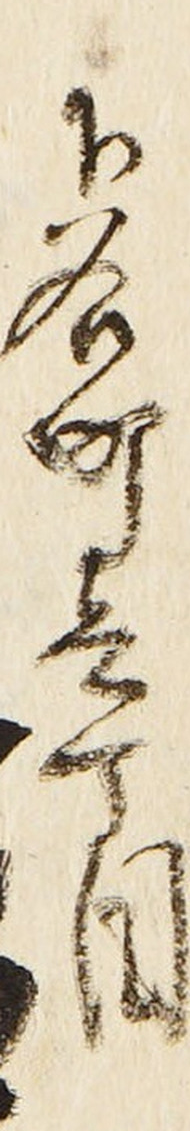下谷町壱丁目
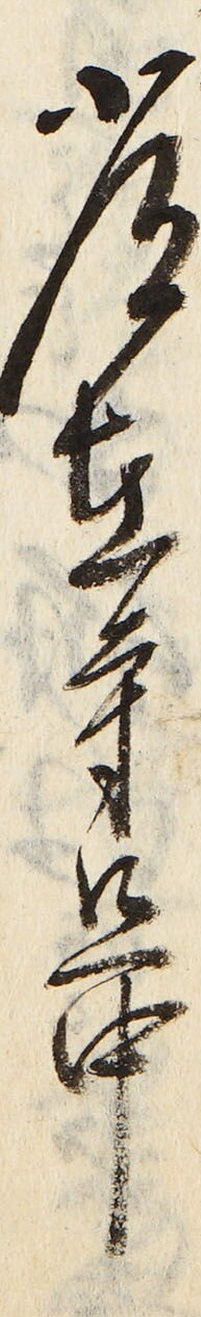常在寺旦中
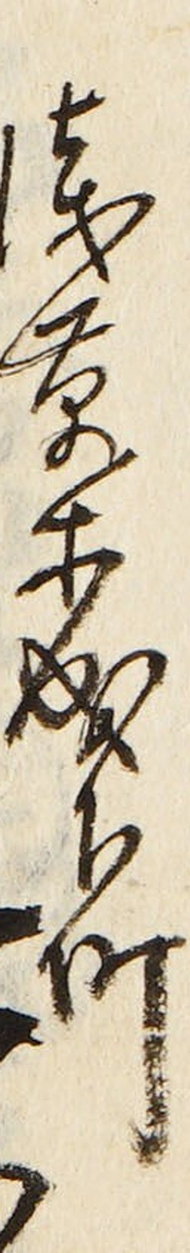浅草森下町
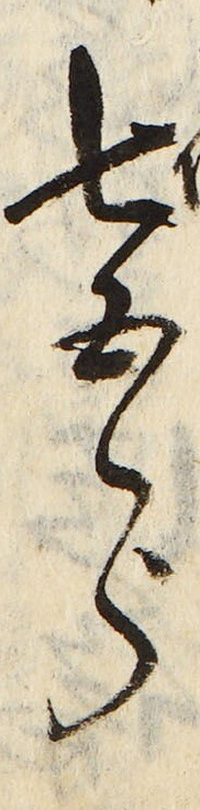七五郎
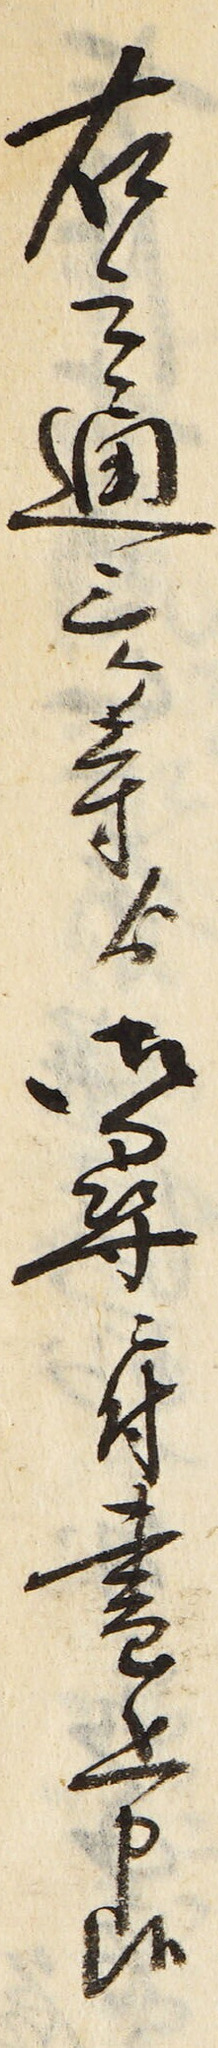右之通三ケ寺ゟ御尋に付書上申候

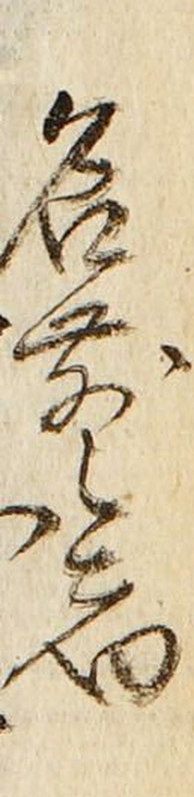名前之者
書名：異流一件日記
